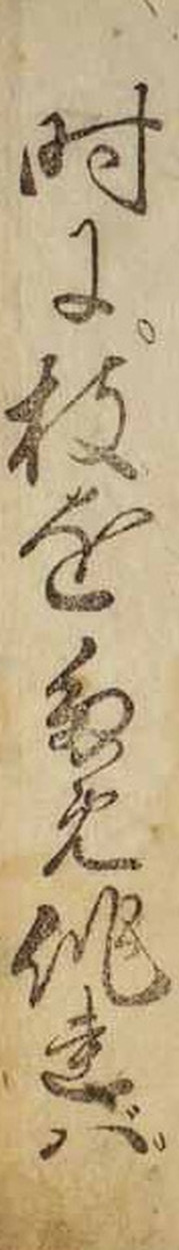時に。枝をため作れば。

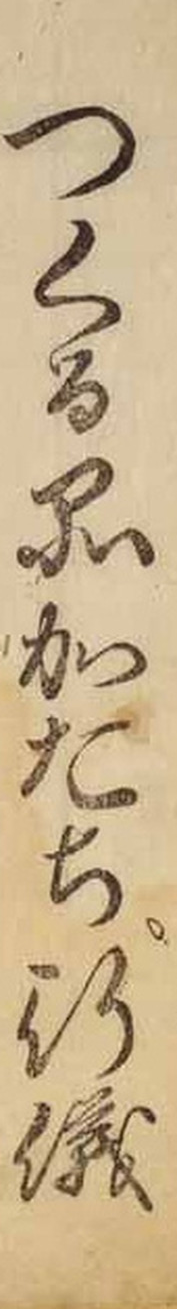つくる品かたち。行儀
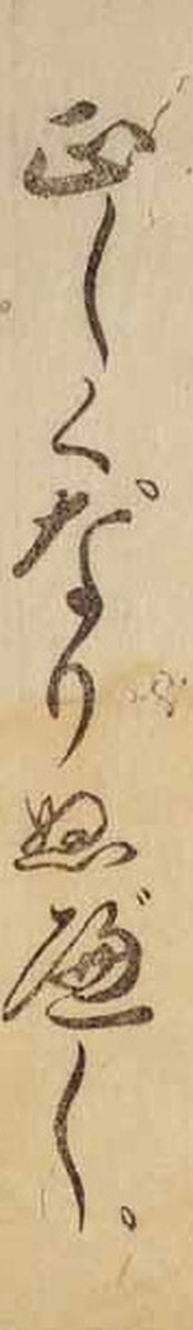正しく。なりぬべし。
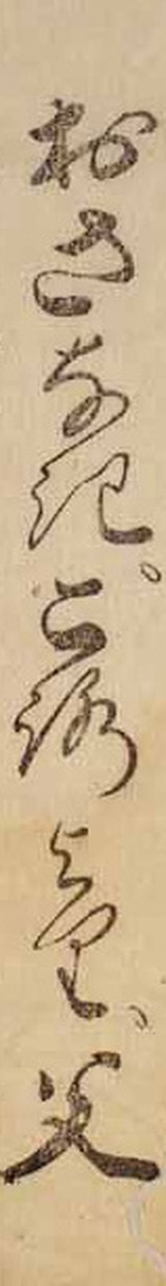おさなき。ころより。父
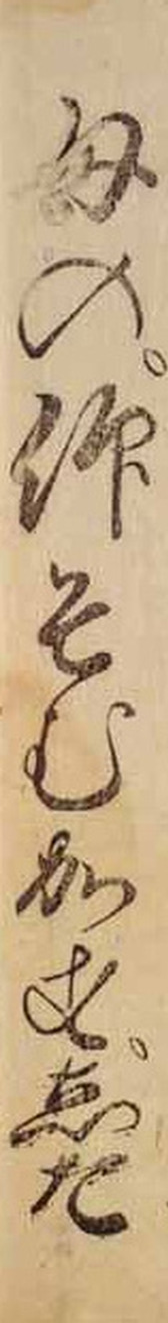母の。仰そむかす。志た
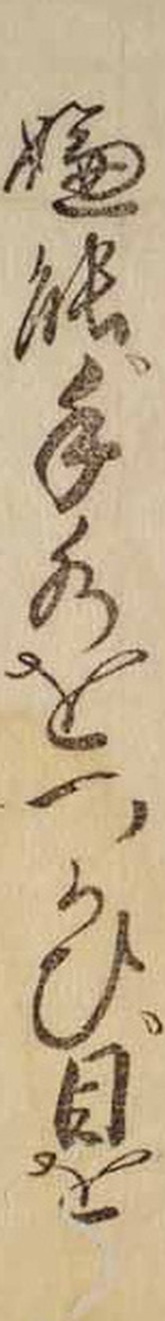嫌能。手水をつかひ。目を
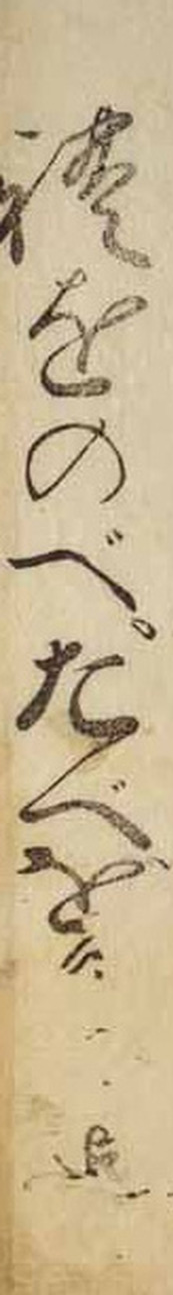礼をのべ。たべを迄

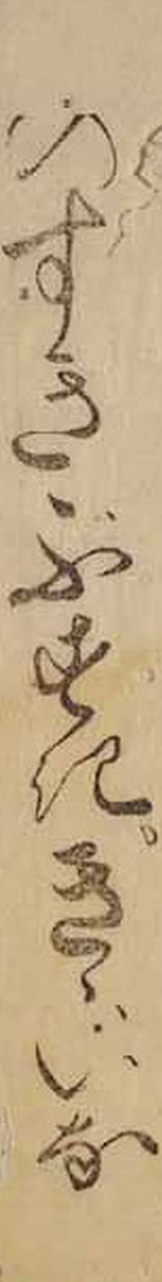のすきぶすき。きらいな
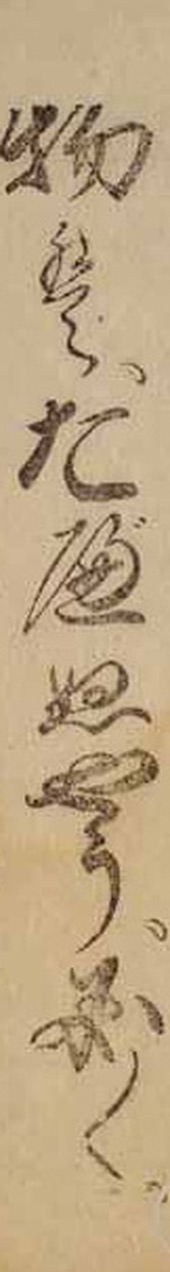物は。たべぬやう。必く。
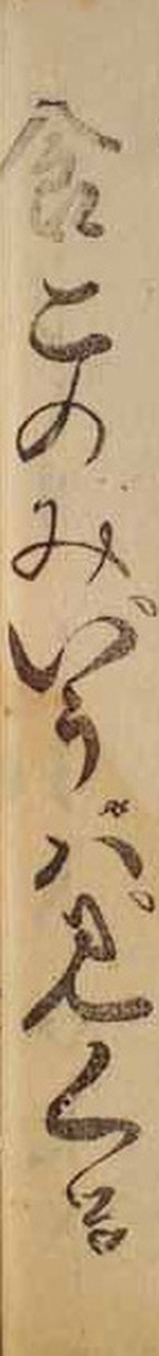食このみ。いうば。見くる
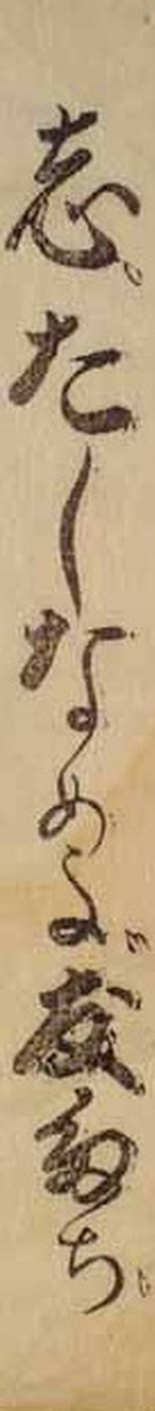し。たしなめよ。友たち。
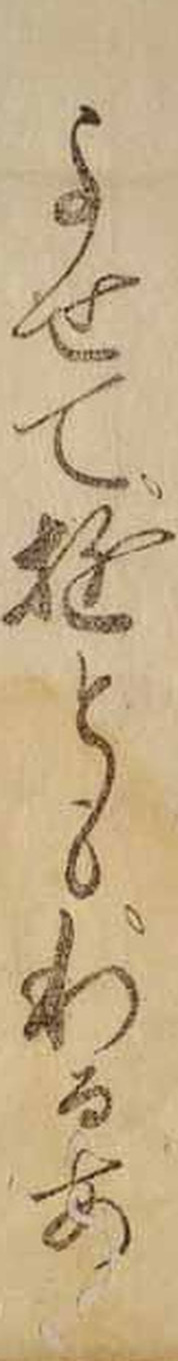よせて。遊とも、わるあ
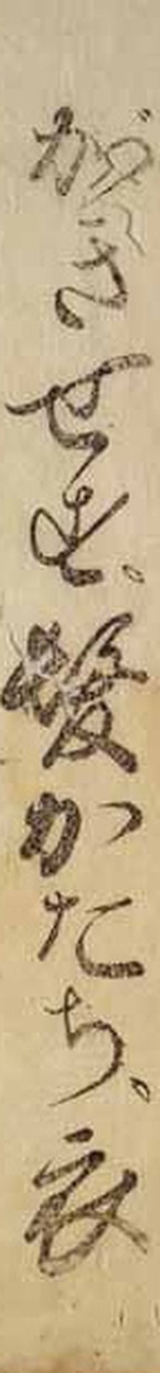がきせす。髪かたち。衣
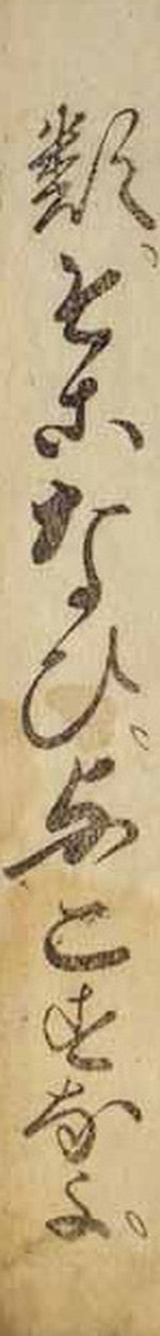類。そこなひ。よこすなよ。

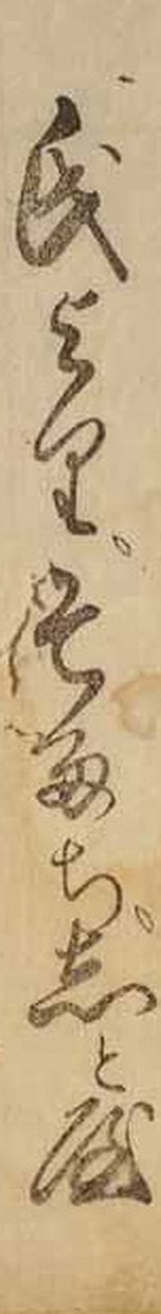氏より。そたち。しとや
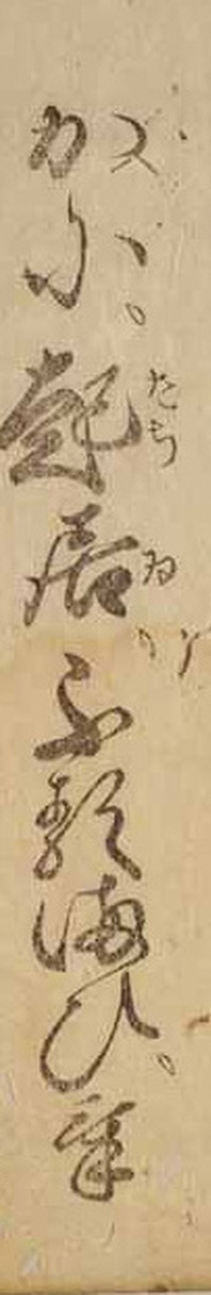かに。起居ふるまひ。気
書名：寺子躾方
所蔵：東京学芸大学教育コンテンツアーカイブ
